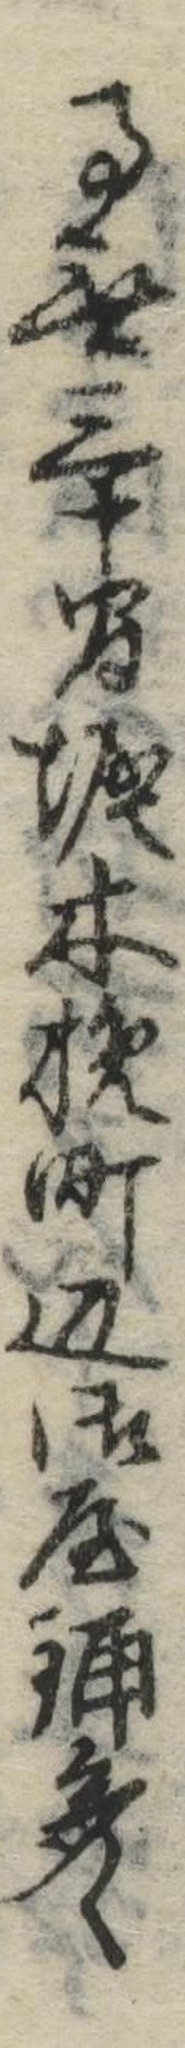事無三十間堀木挽町辺御屋鋪多く
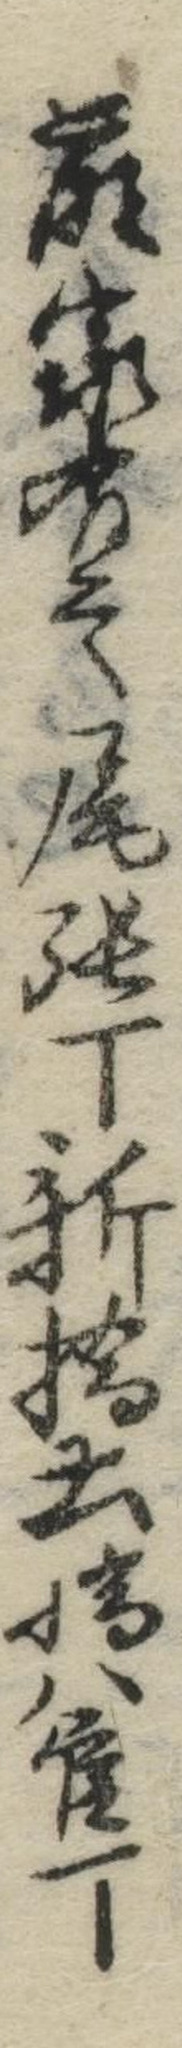崩家有之尾張町新橋出橋八官町
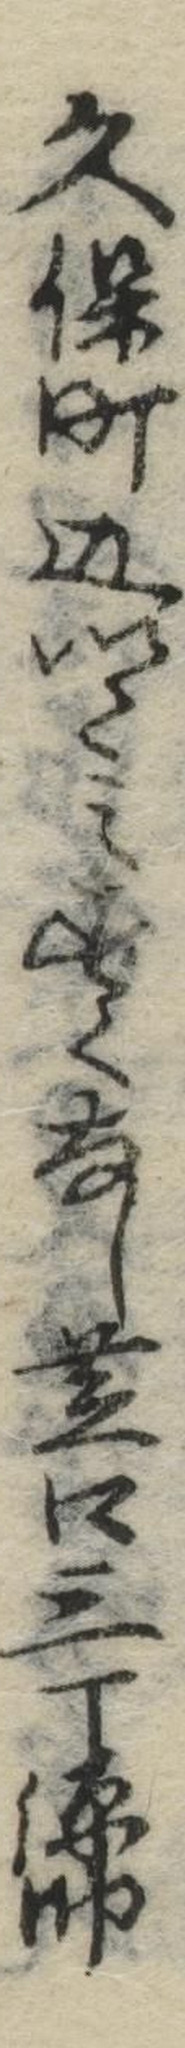久保町辺いたみすくなし芝口三町源助
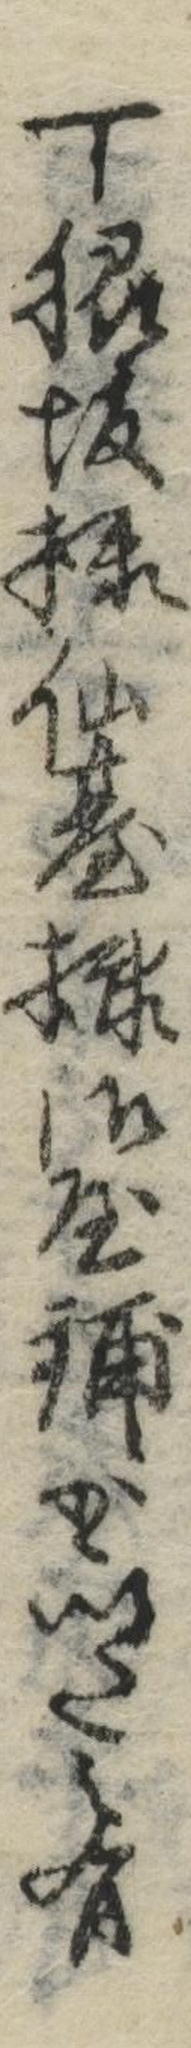丁脇坂様仙台様御屋鋪少々いたミ有
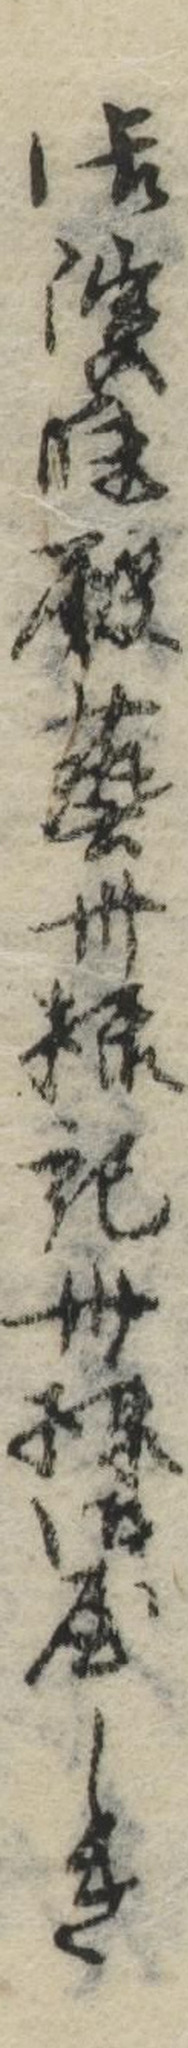御浜御殿芸州様紀州様御屋しき
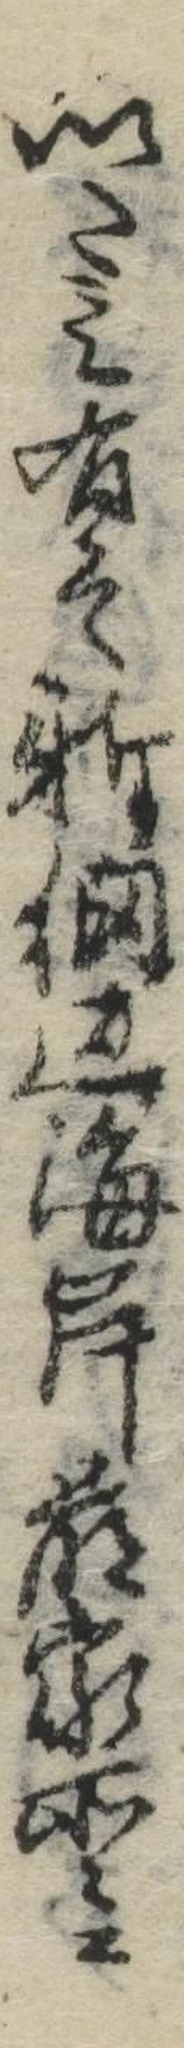いたミ有之新佃辺海岸崩家所々二

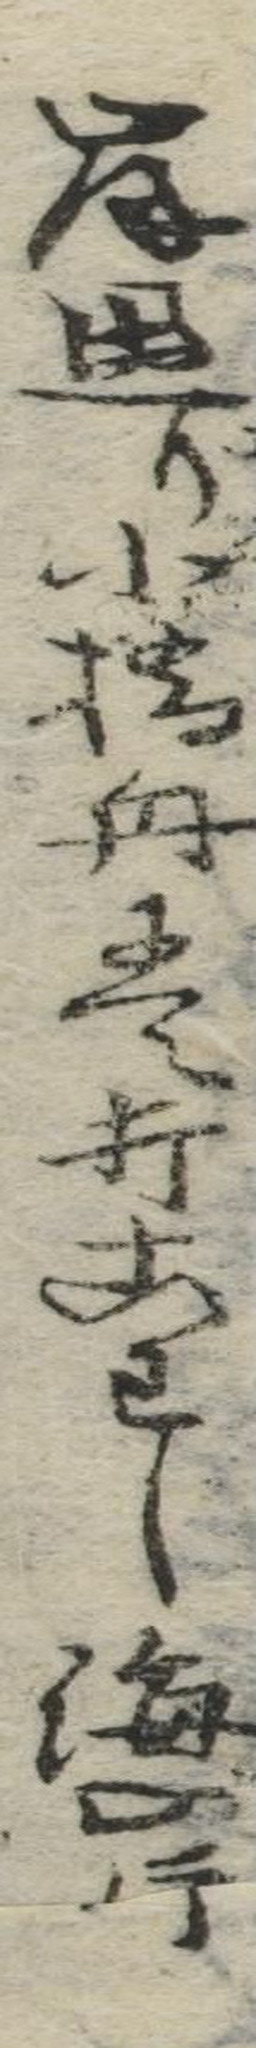岸通り小橋舟にて打こわし海岸
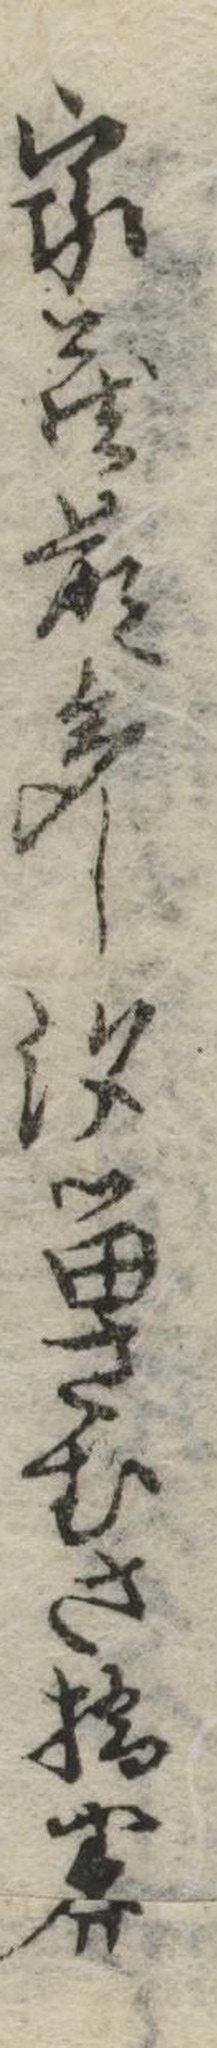家蔵崩多し汐留さむさ橋半分
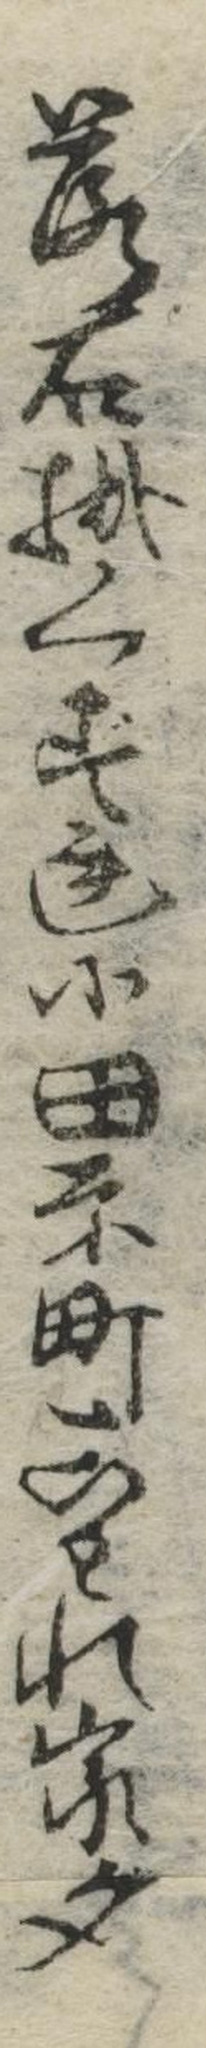落石掛くすれ小田原町こわれ家多
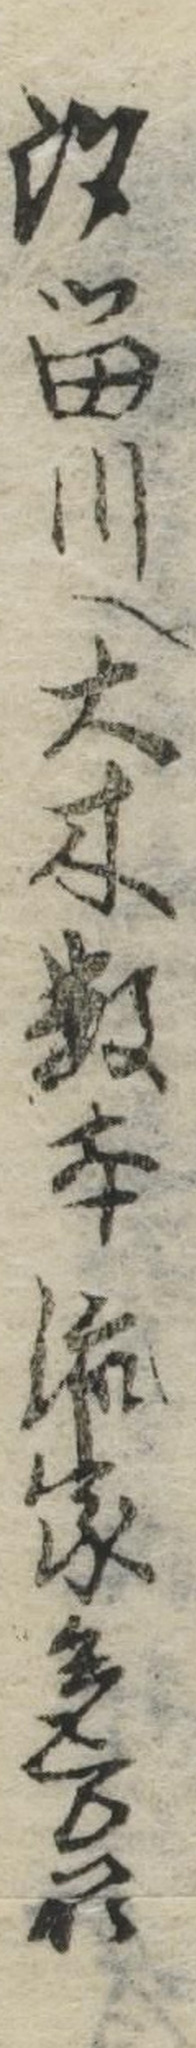汐留川へ大木数本流家多方崩
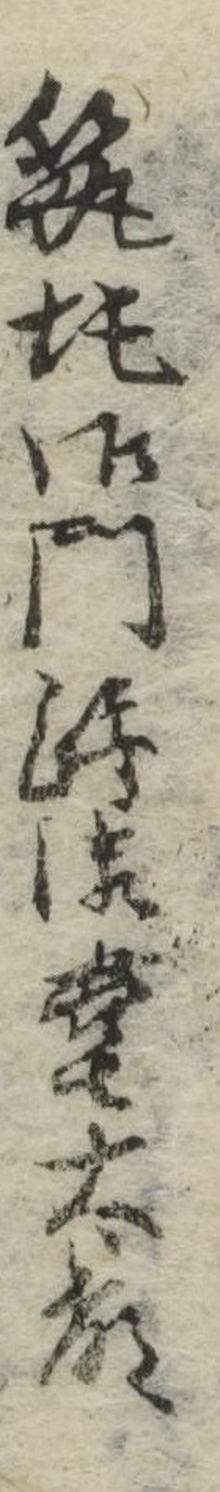築地御門跡御堂大崩
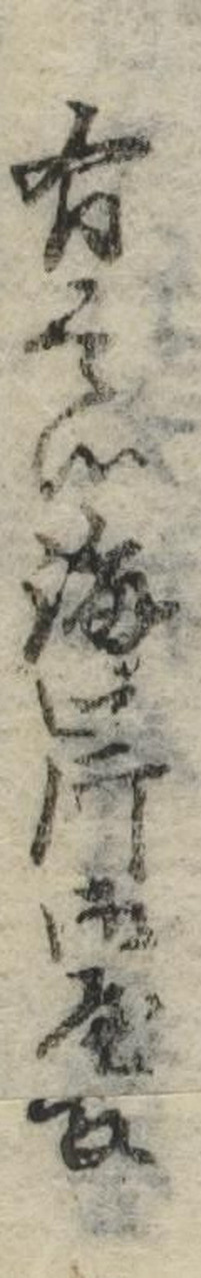有之候海岸御屋敷
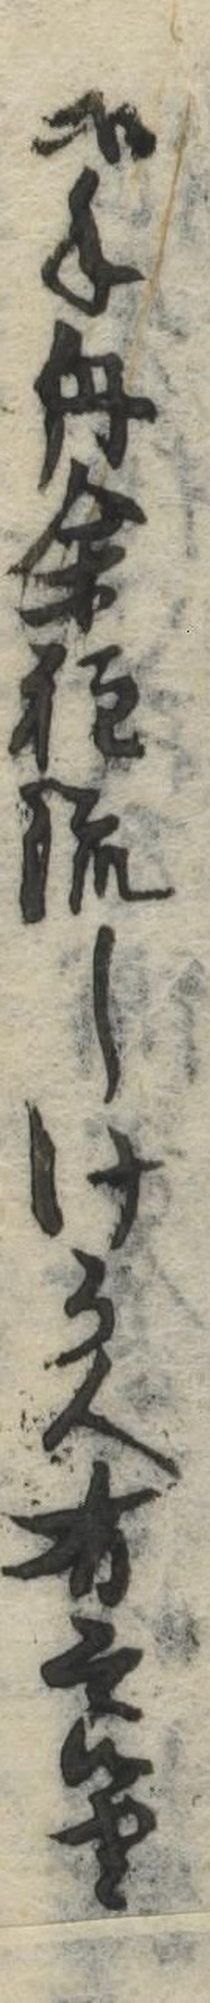御手舟余程流しけか人有之候由
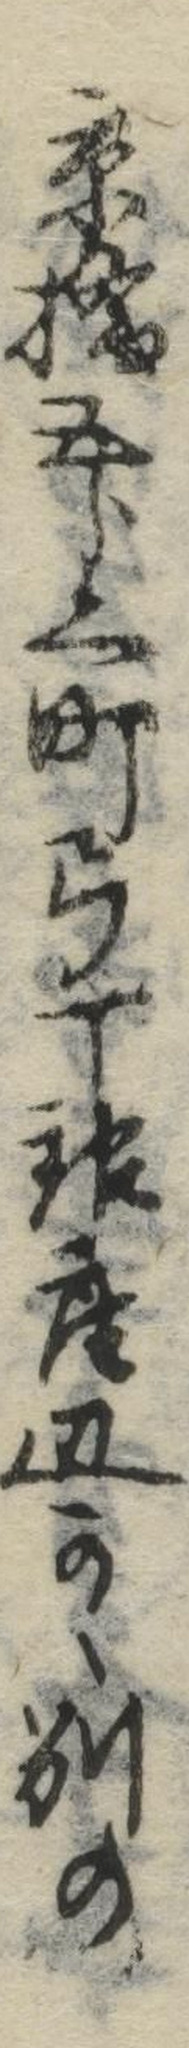京橋五郎兵衛町弓丁銀座辺かく別の
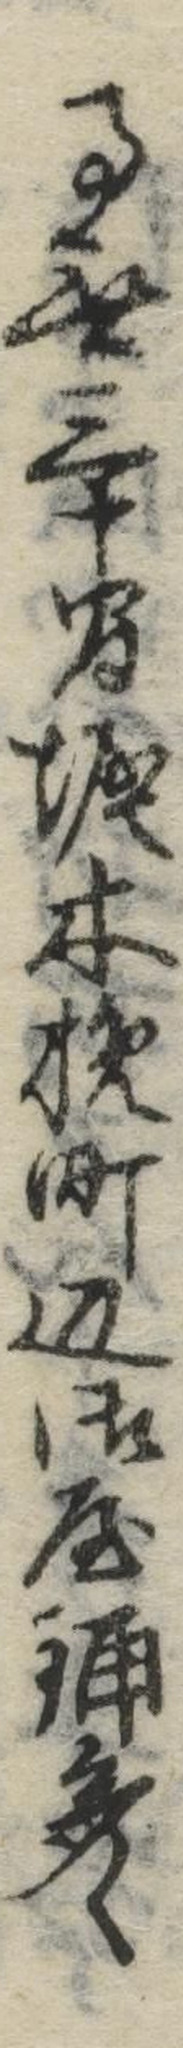事無三十間堀木挽町辺御屋鋪多く
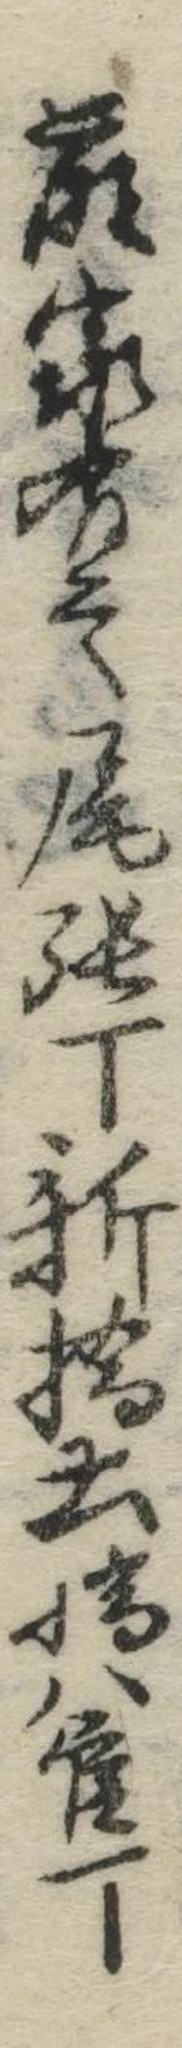崩家有之尾張町新橋出橋八官町
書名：安政三年辰八月廿五日夜　大江都御屋敷方寺社市中共　大嵐水入場所明細書之寫　并街道筋近郷聞書
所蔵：東京大学地震研究所図書室 Earthquake Research Institute Library, The University of Tokyo, JAPAN
